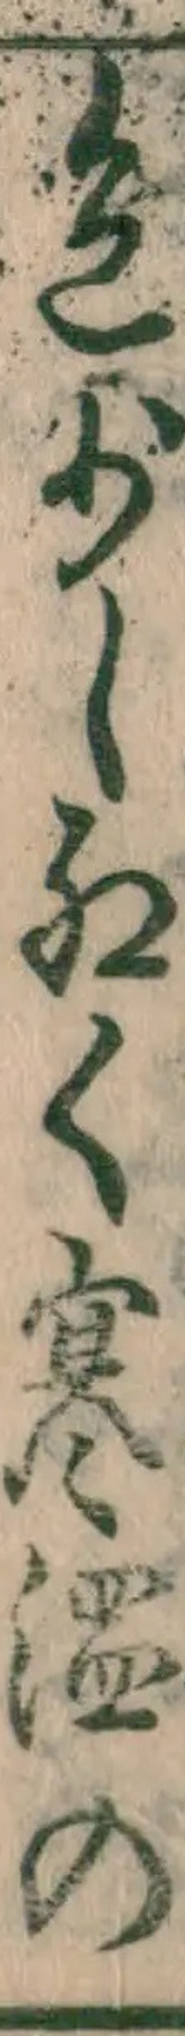色少し紅く寒温の
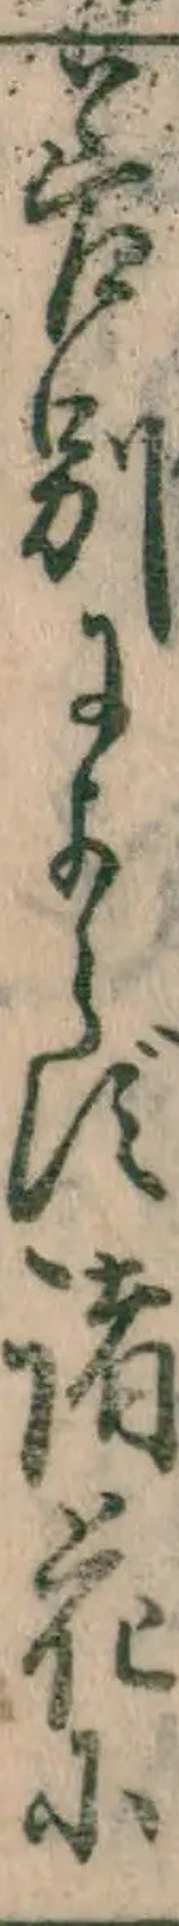差別によらず諸花に
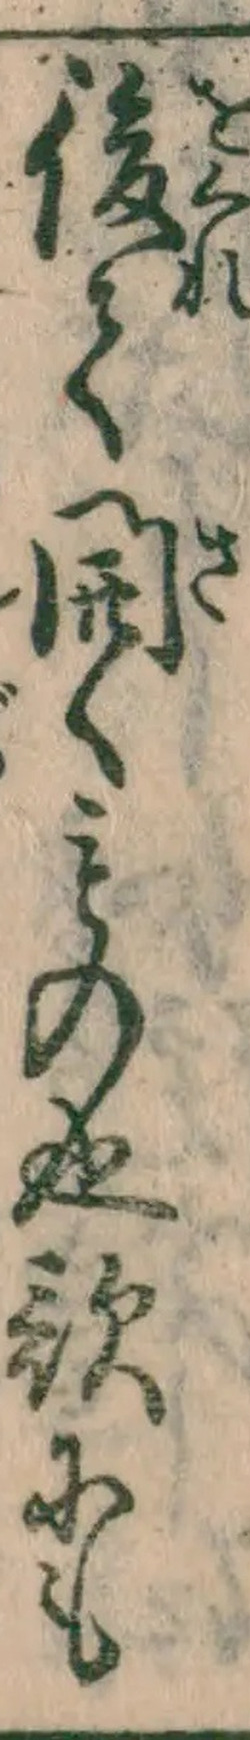後て開くもの也歌にも
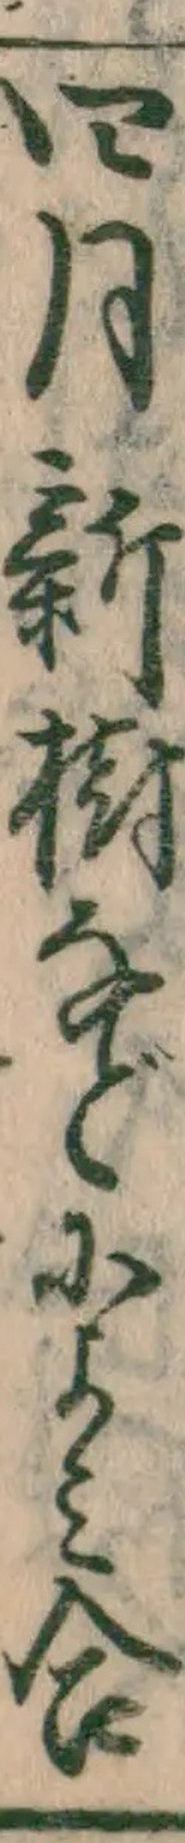四月新樹などによみ合
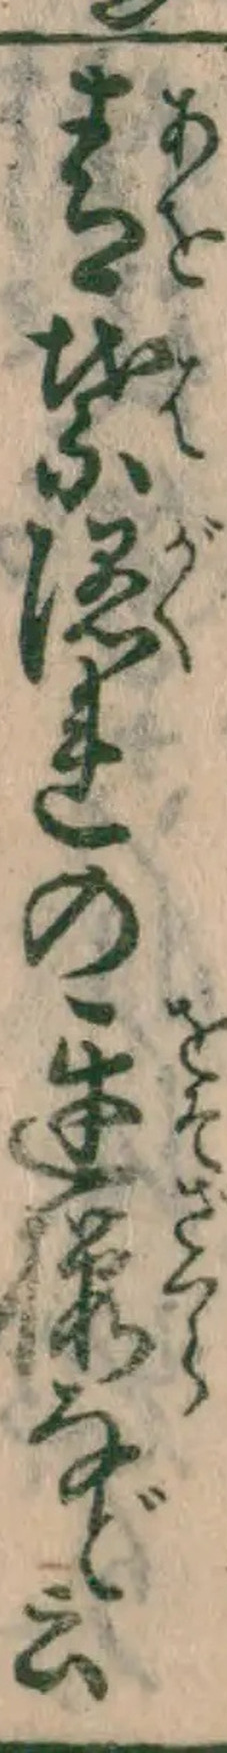青葉隠れの遅桜など云
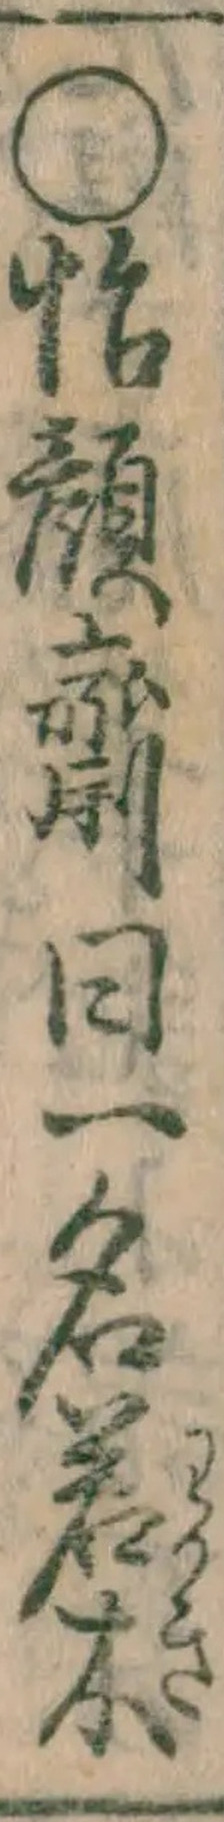○怡顔斎曰一名若木
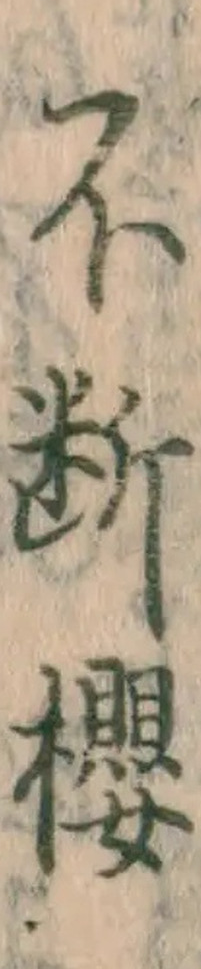不断桜
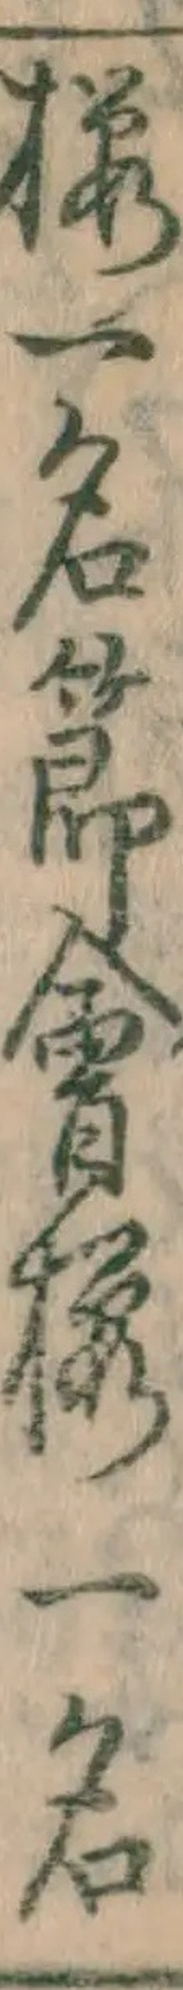桜一名節会桜一名
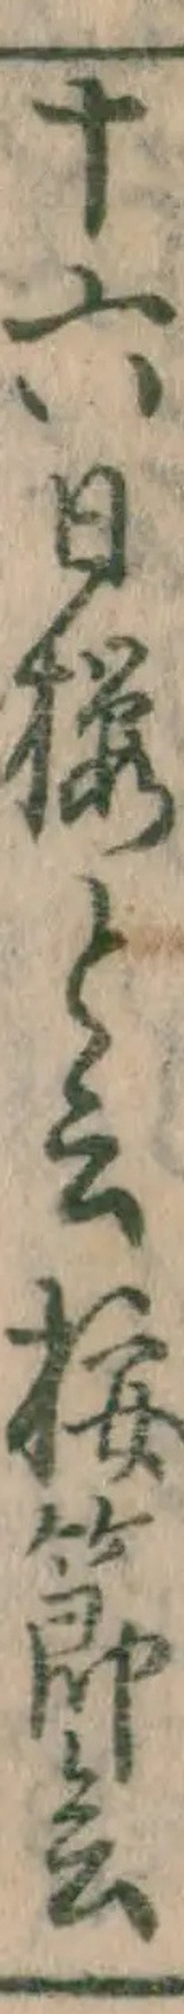十六日桜と云按節会
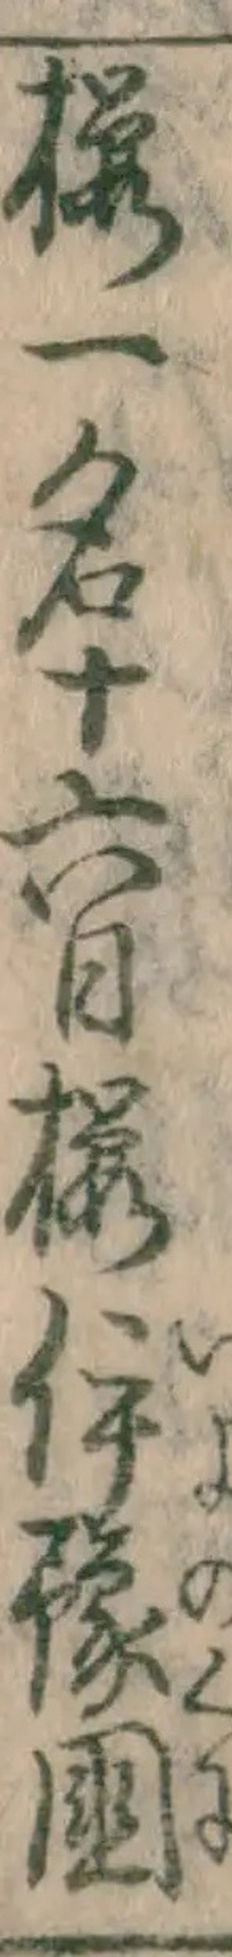桜一名十六日桜伊予国
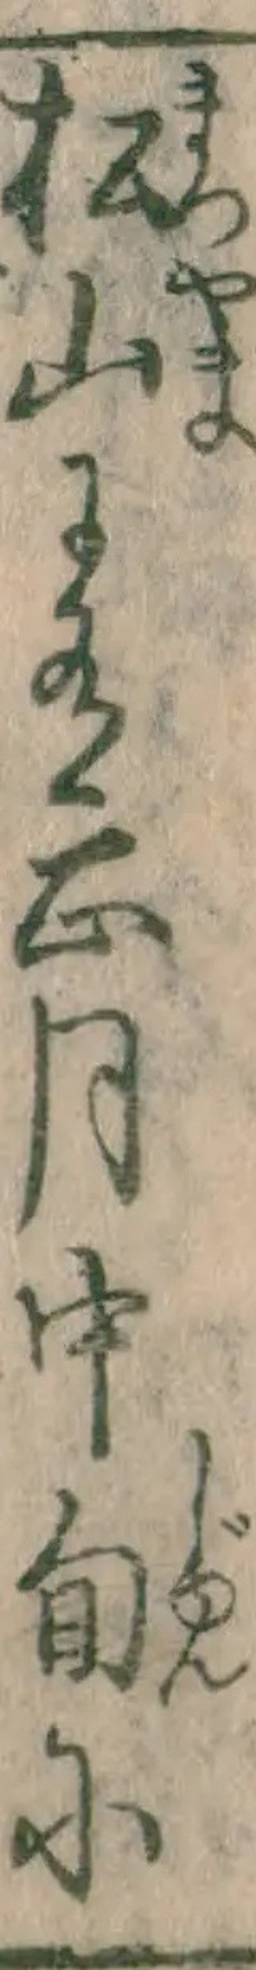松山に有正月中旬に
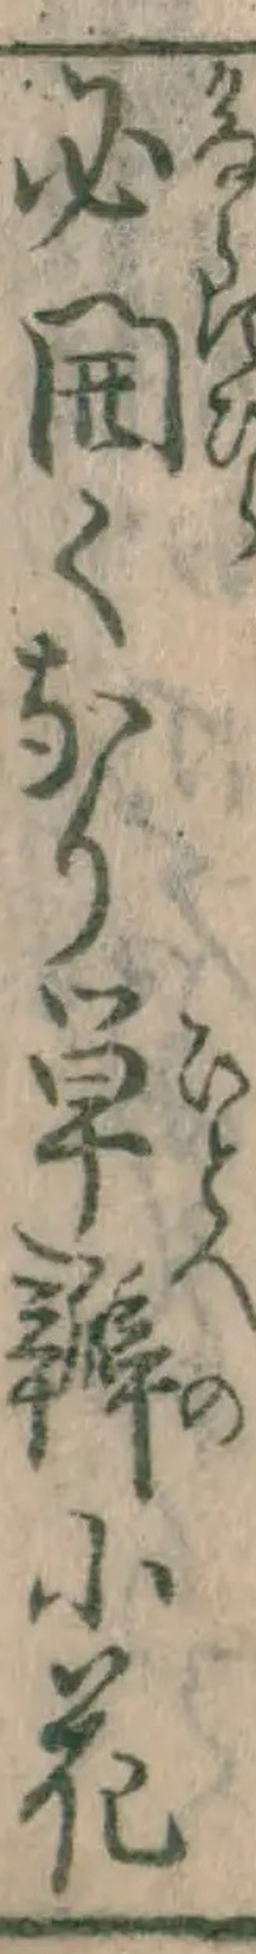必開くなり単弁小花
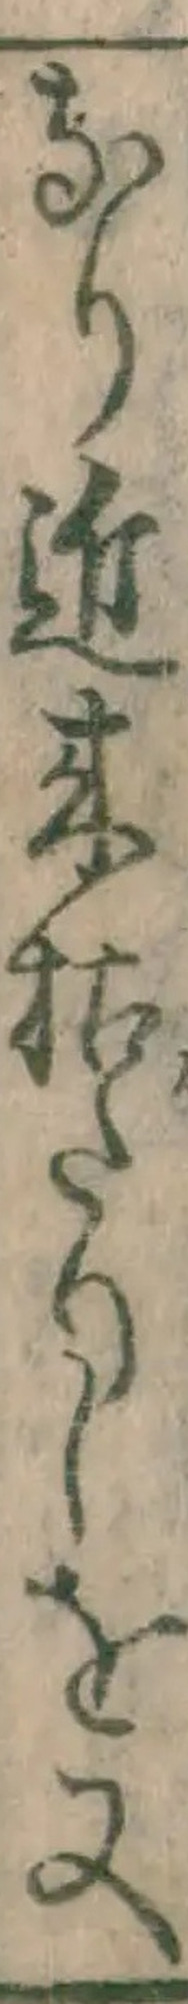なり近来枯たりしを又

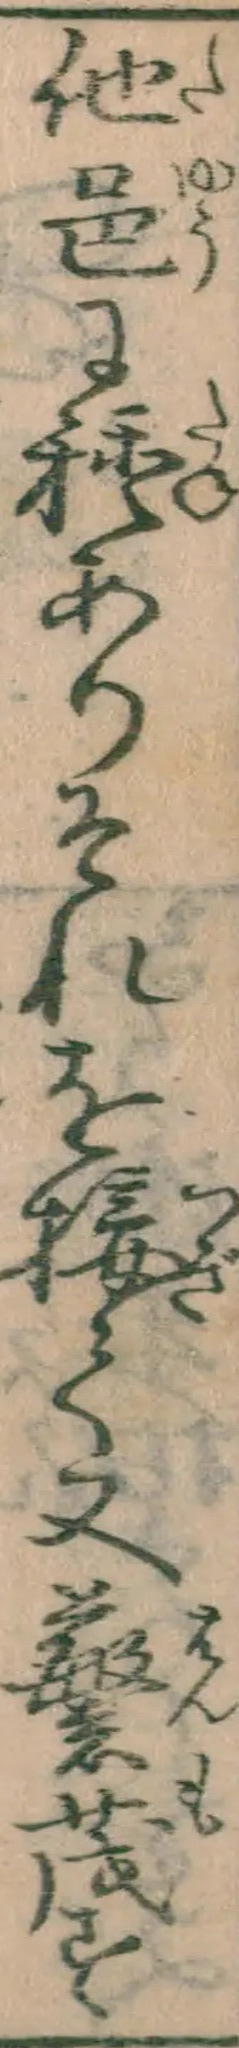他邑に種ありそれを接て又蘩茂す
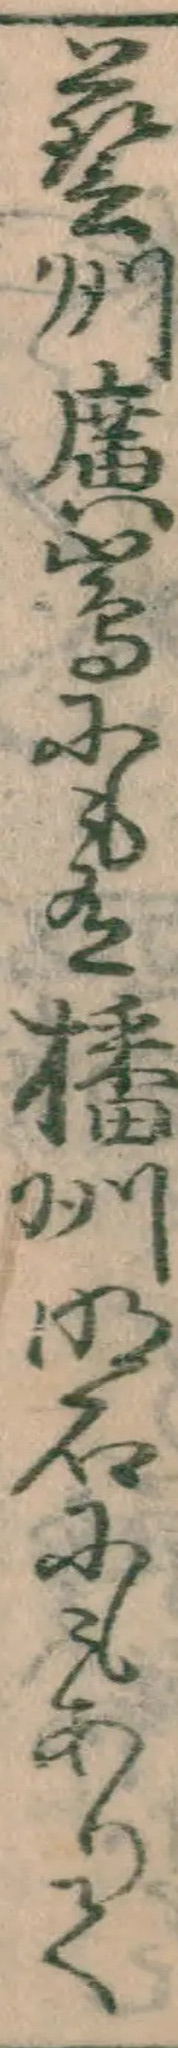芸州広島にも有播州明石にもありて
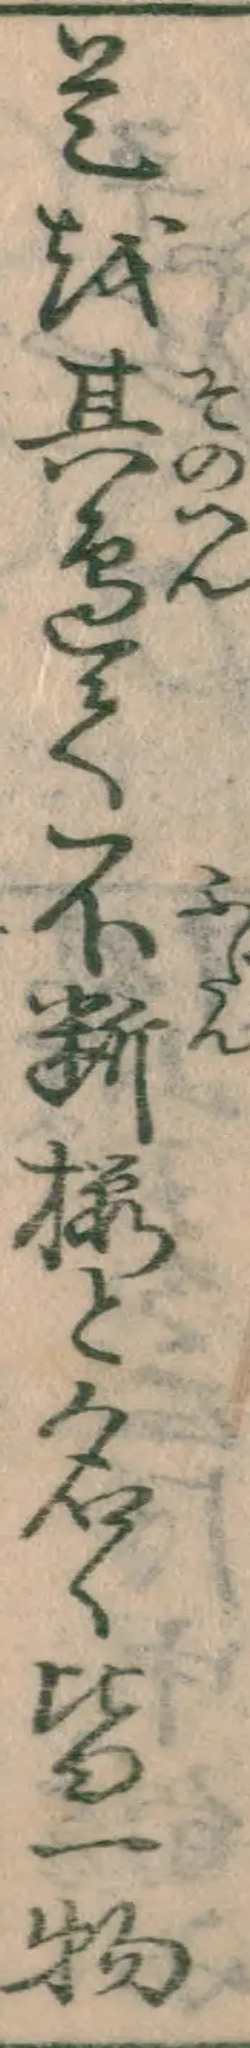是を其辺て不断桜と名く皆一物
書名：怡顔齋櫻品
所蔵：国立国会図書館 National Diet Library, JAPAN
